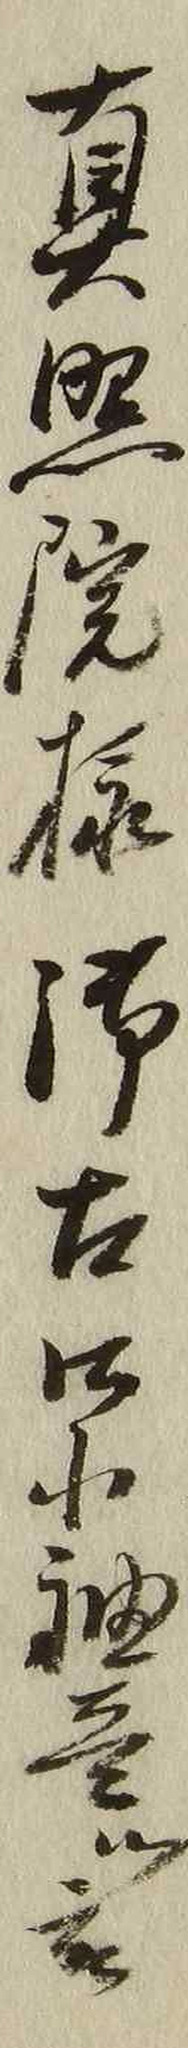真照院様御古御小袖壱ツ被
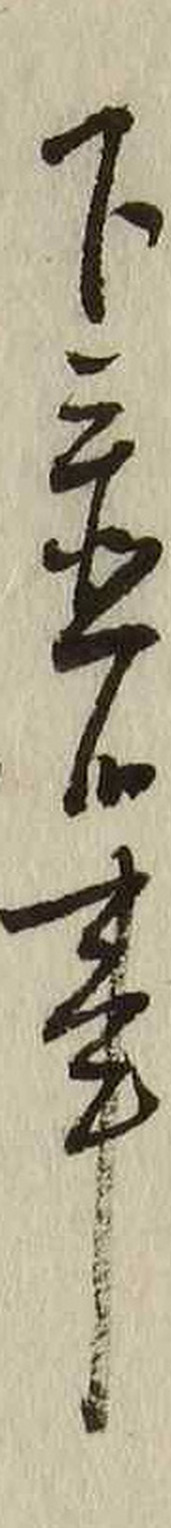下置候事
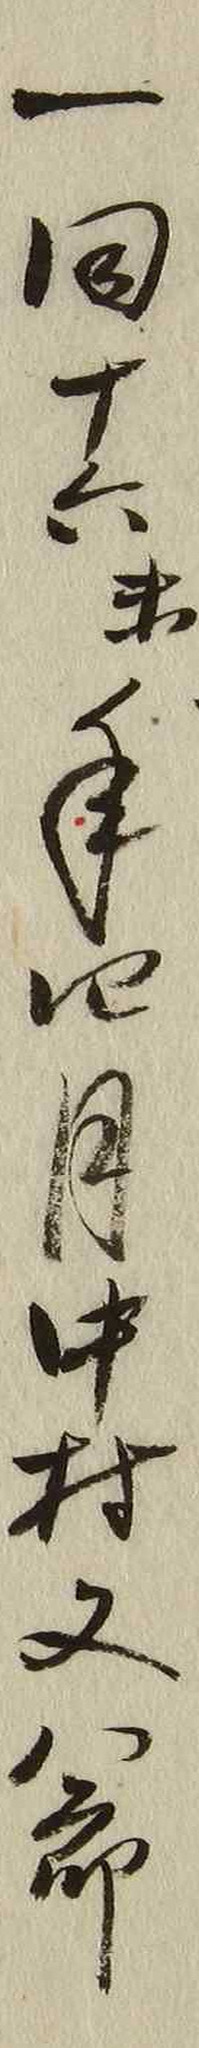一同十六未年四月中村又八郎
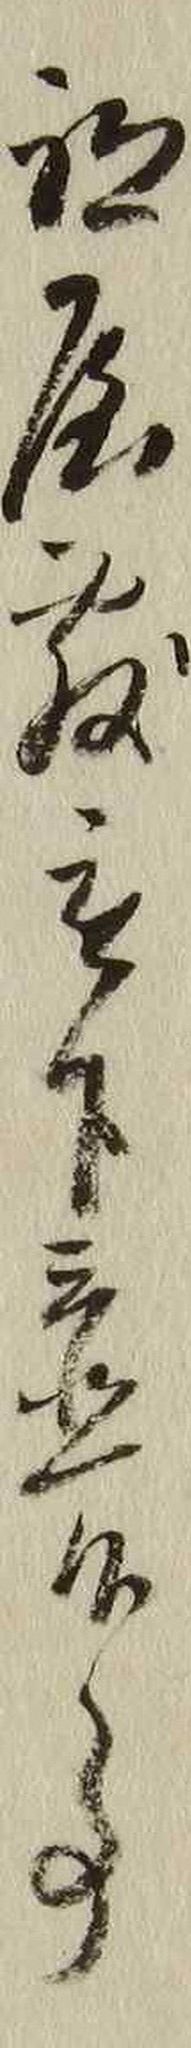跡屋敷被下置候事
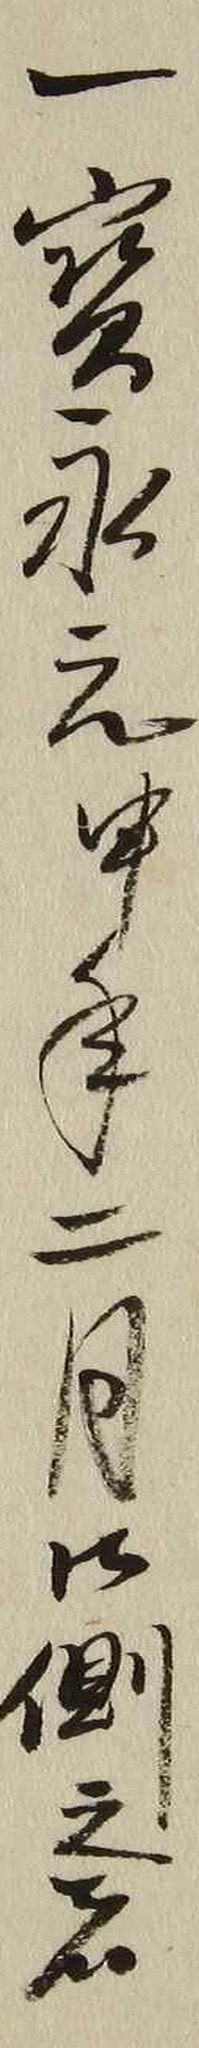一宝永元申年二月御側之者
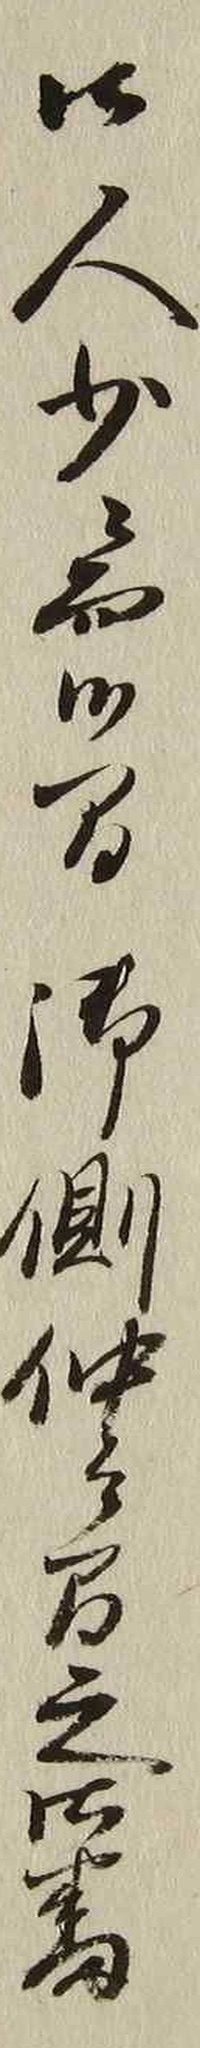御人少ニ而候間御側仲ケ間之御番
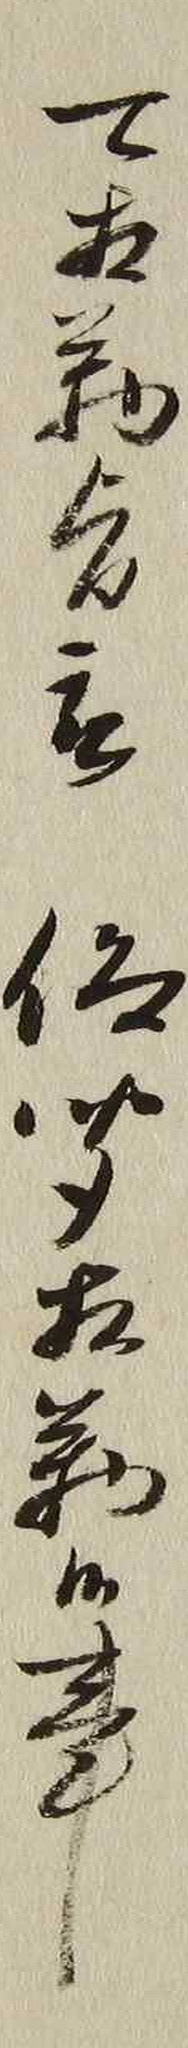可相勤旨被仰聞相勤候事
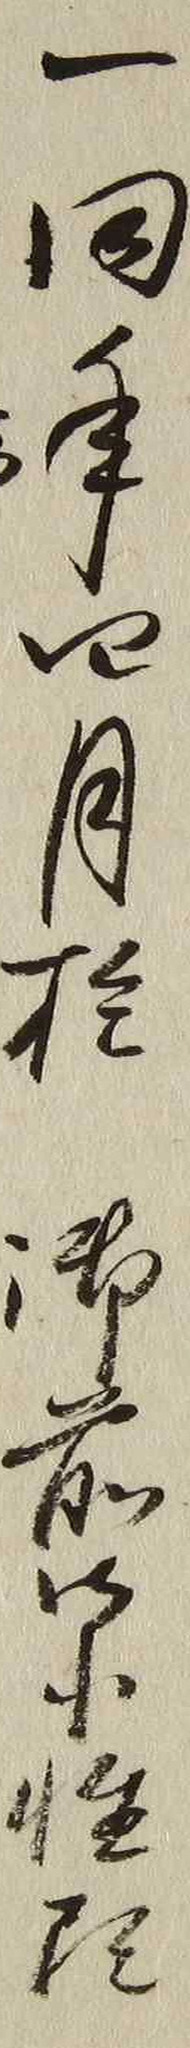一同年四月於御前御小性頭
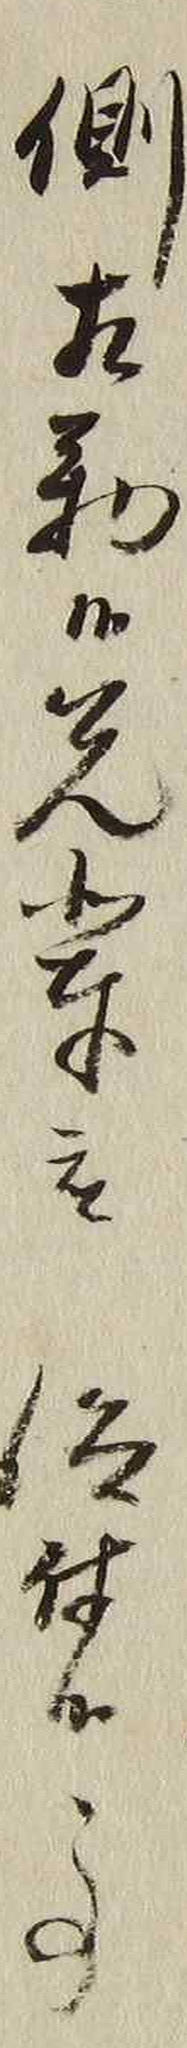側相勤候先輩被仰付候事
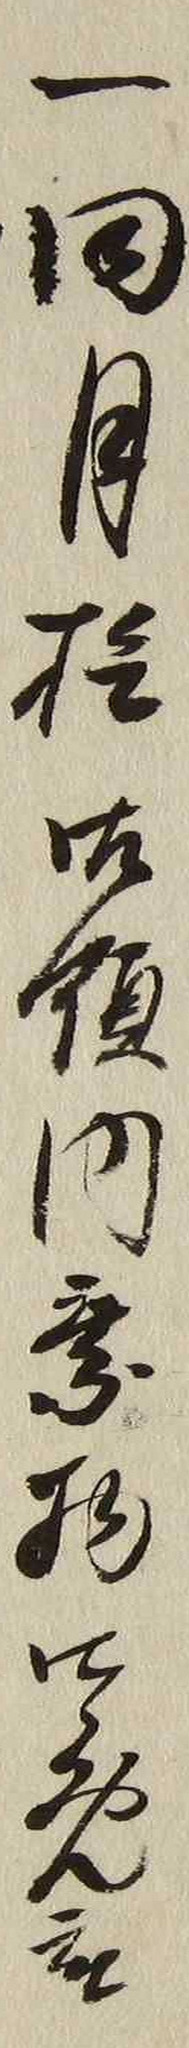一同月於御領内乗物御免被
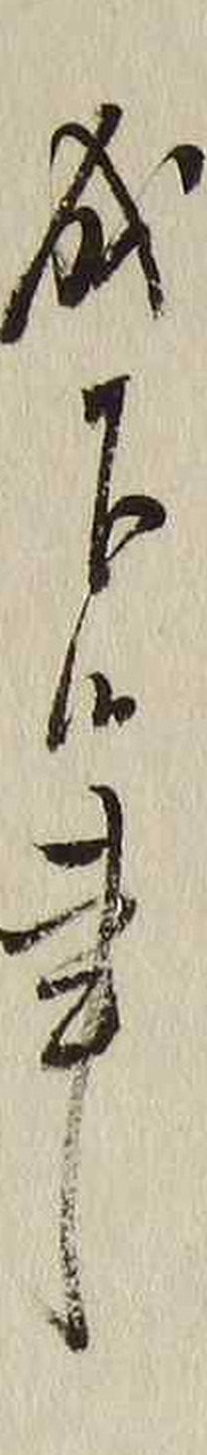成下候事
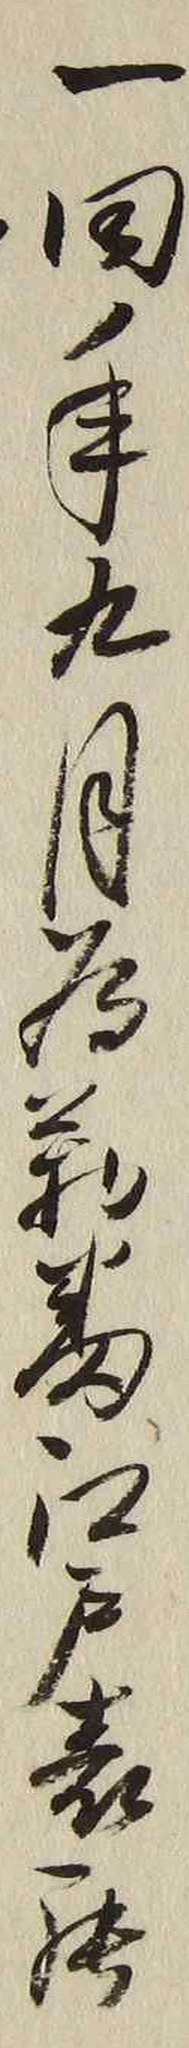一同年九月為勤番江戸表罷
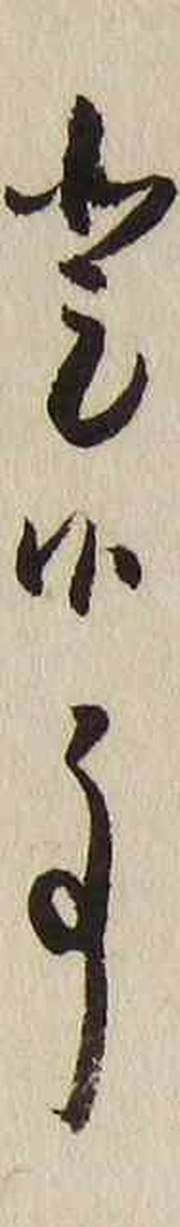登候事
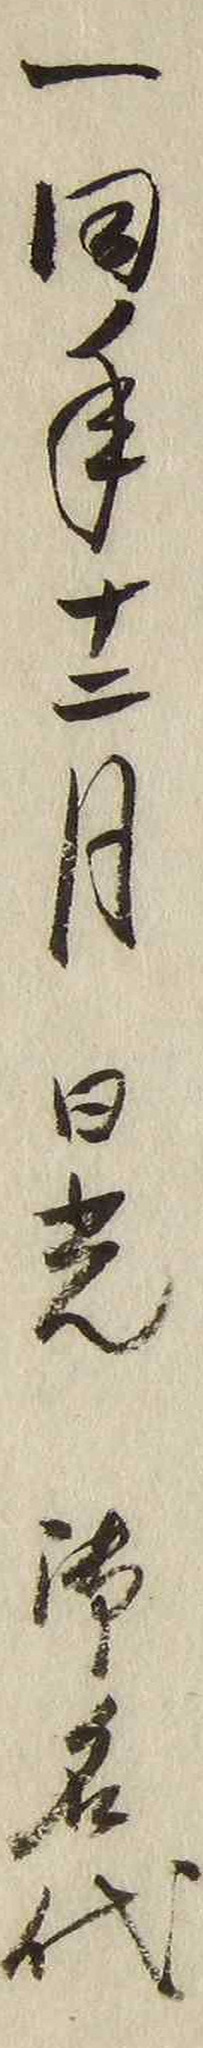一同年十二月日光御名代

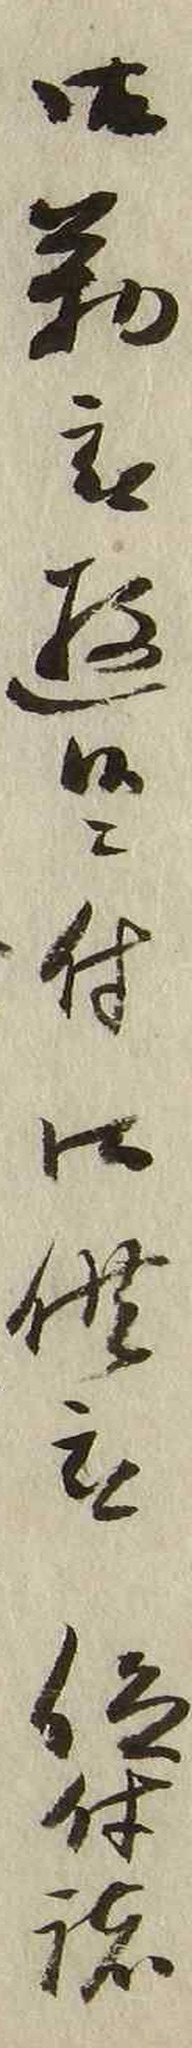御勤被遊候ニ付御供被仰付諸
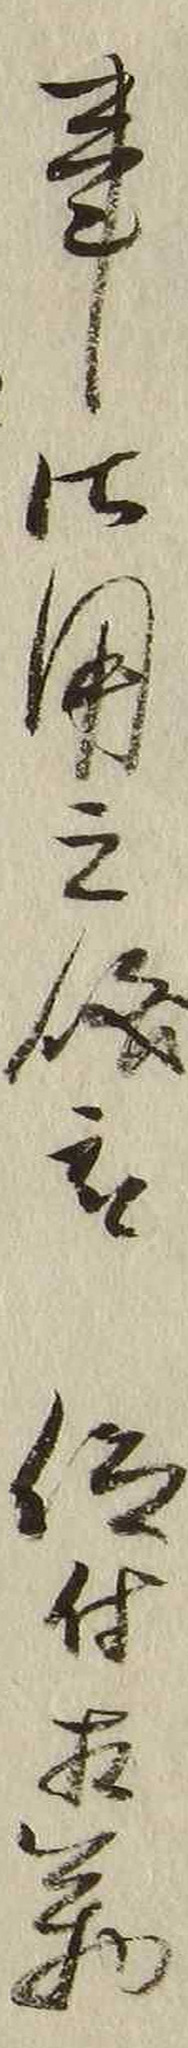事御用之儀被仰付相勤
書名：諸士系譜　巻之355　す之部5
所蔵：会津若松市立会津図書館
